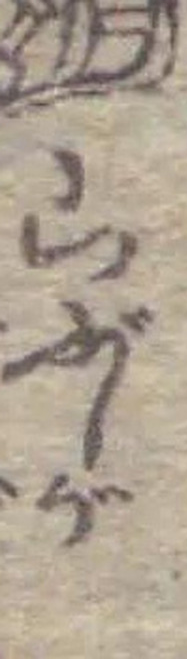山ぶしが
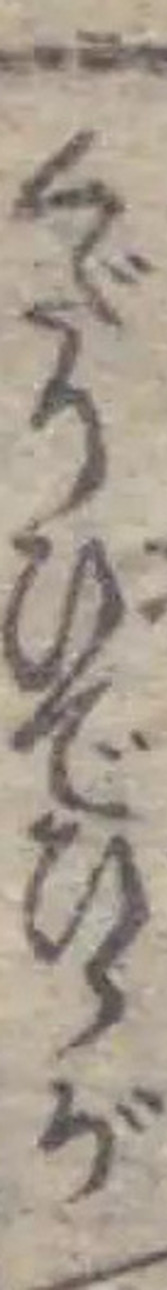くだりひでひらが
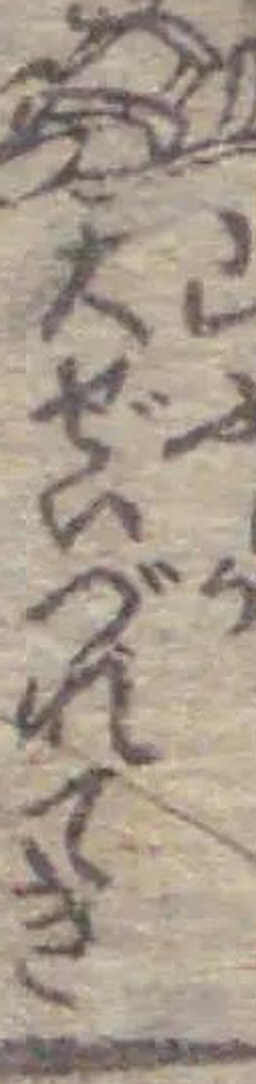大ぜいづれてき
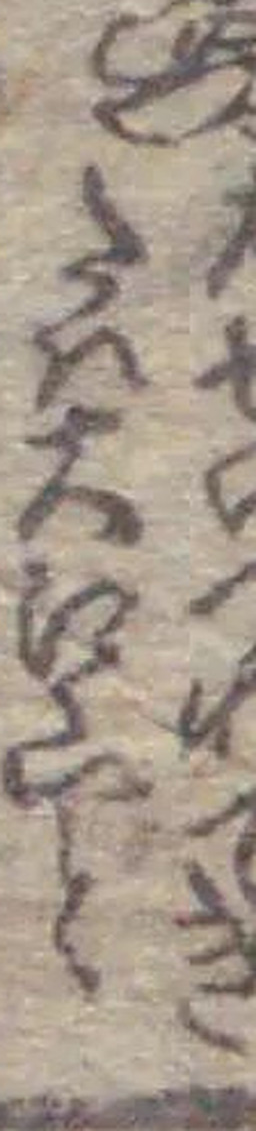たは大江山と
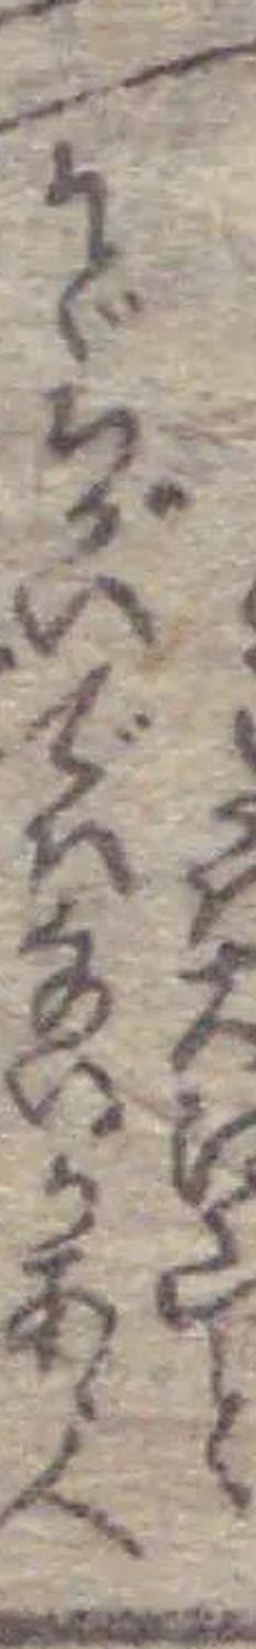かどちがいではないかあゝ人
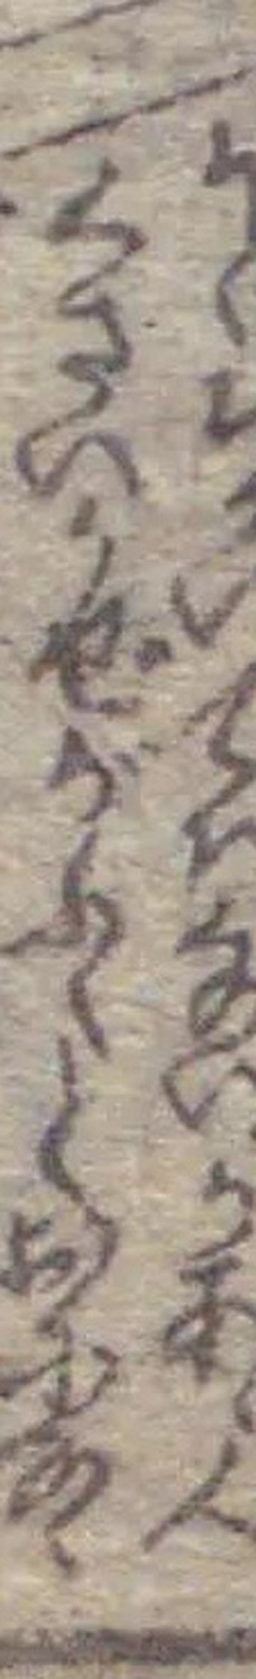くさいかぜがふくとおになく
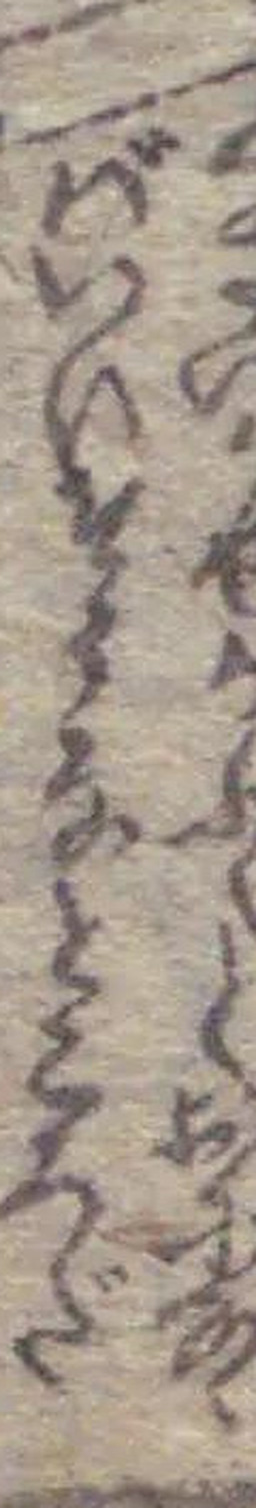ばいひそうなところだ
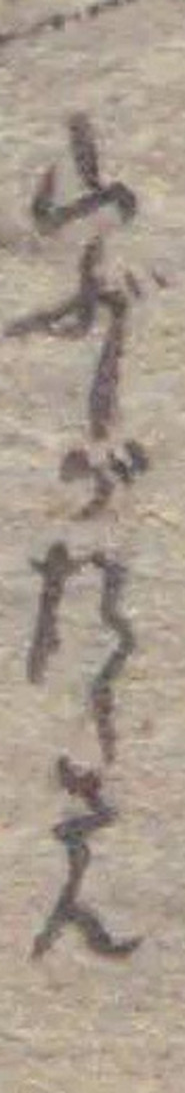山ぶしがたくさん
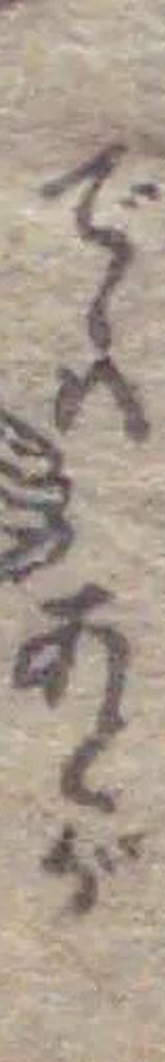でゝはあとが
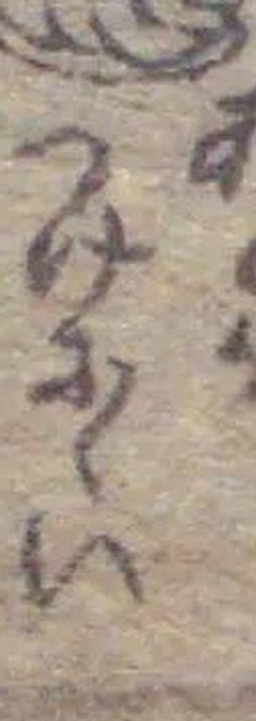つけにくい

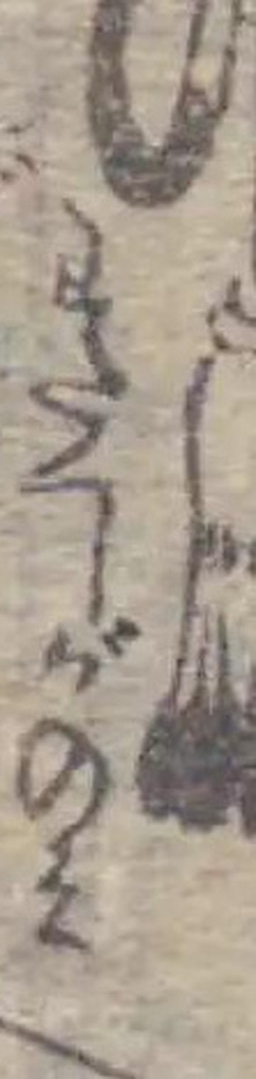わたくしがのみ
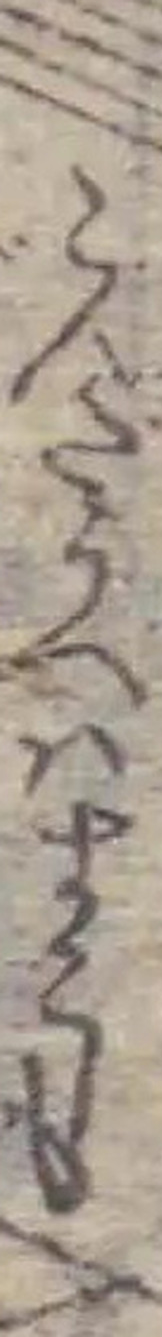こんだうへはすこしも
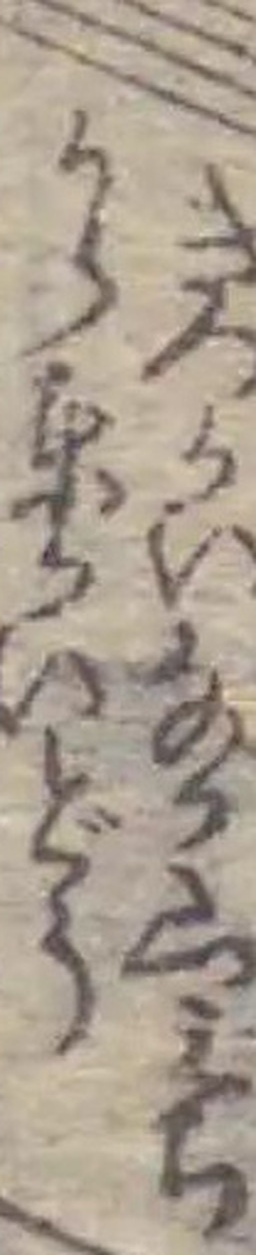から東かいどう
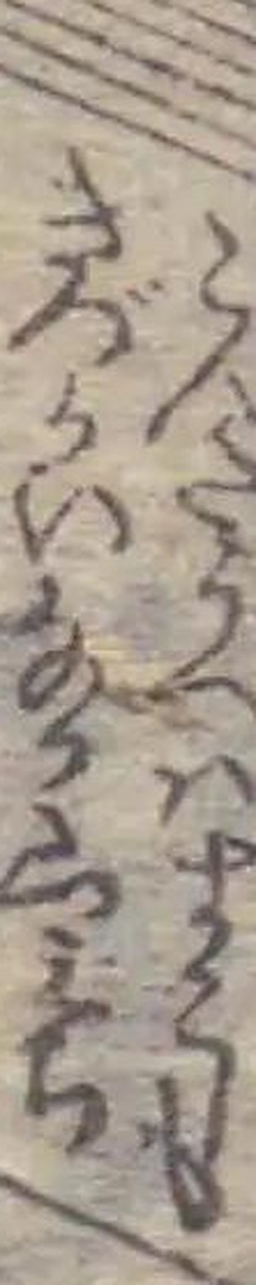きづかいなく山みち
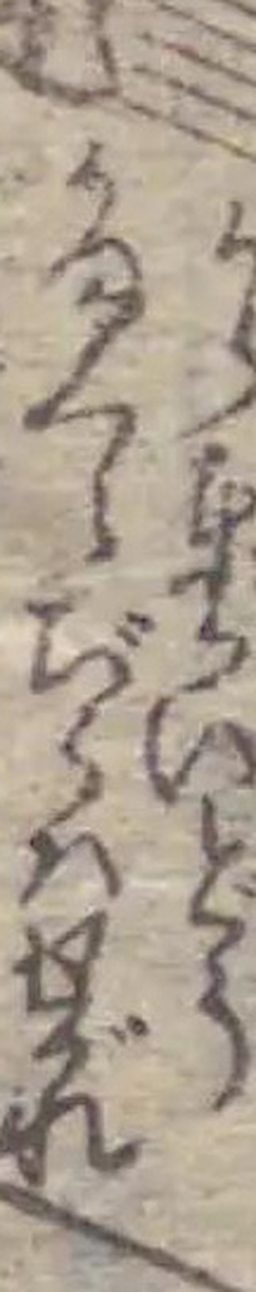かまくらぢうはせがれ
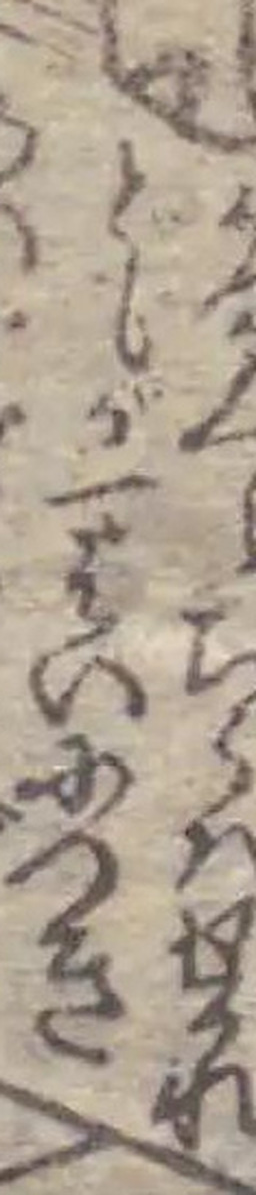ともが一はいにつき
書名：通増安宅関 2巻
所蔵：国立国会図書館 National Diet Library, JAPAN
